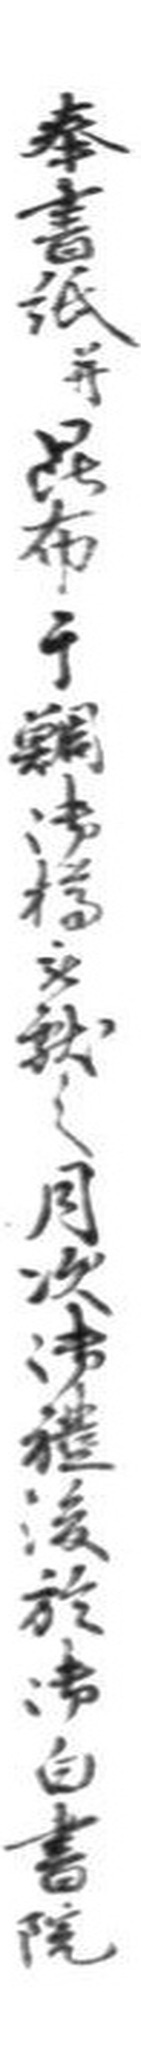奉書紙并昆布干鯛御樽被献之月次御礼後於白書院
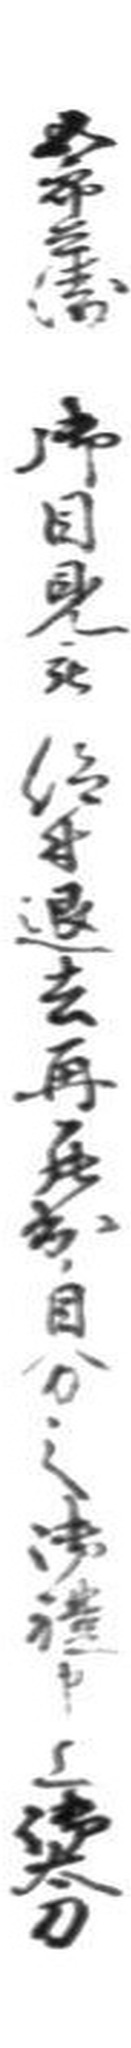五郎兵衛御目見被仰付退去再罷出自分之御礼申上御太刀
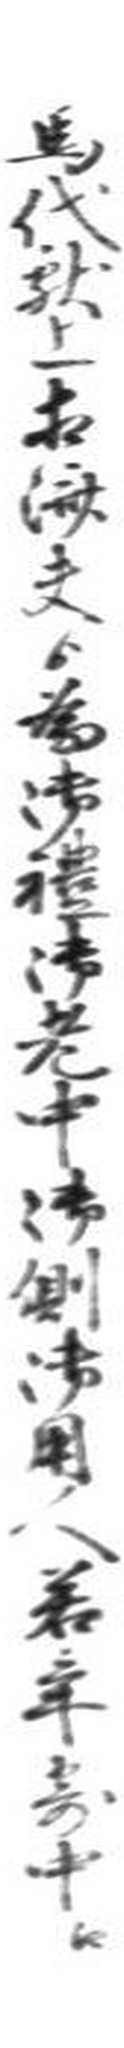馬代献上相済夫ゟ為御礼御老中御側御用人若年寄中江
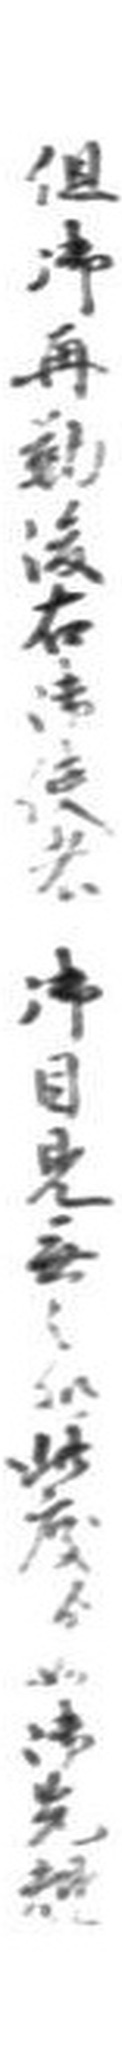但御再勤後右御使者御目見無之処此度ゟ如御先規
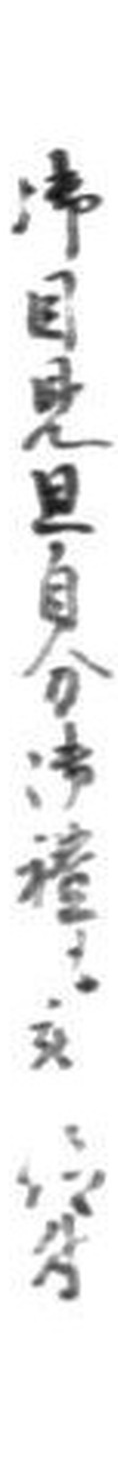御目見且自分御礼も被仰付
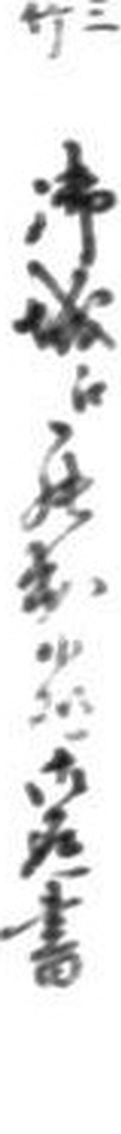竹御城江罷出候処御返書
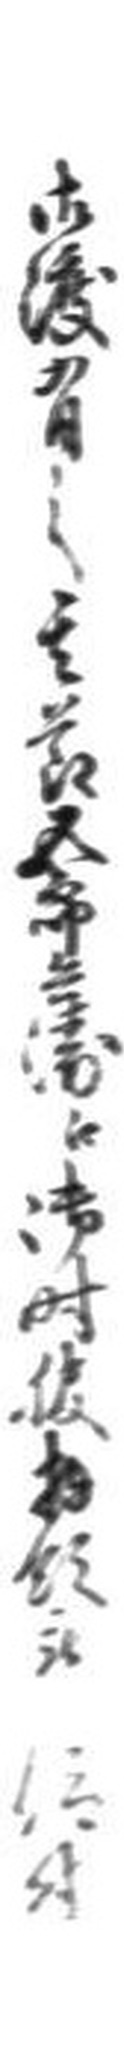御渡有之其節五郎兵衛江御時服拝領被仰付

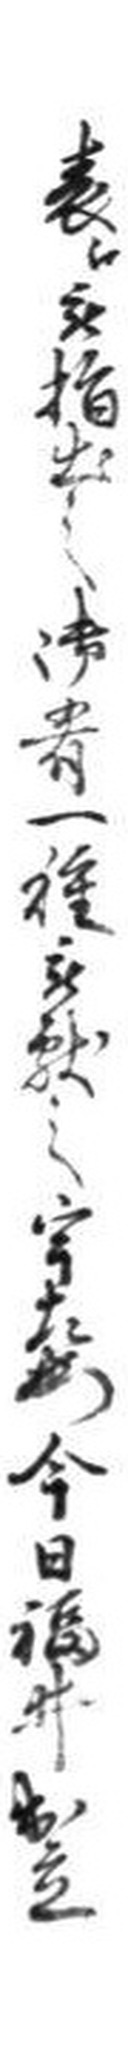表江被指出之御肴一種被献之宇左衛門今日福井出立
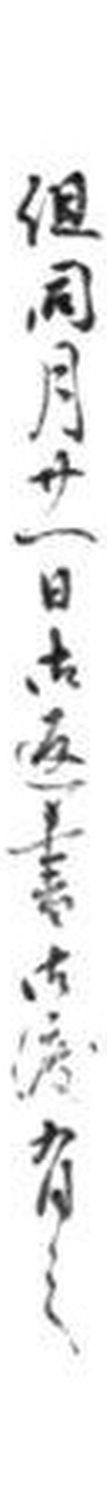但同月廿一日御返書御渡有之
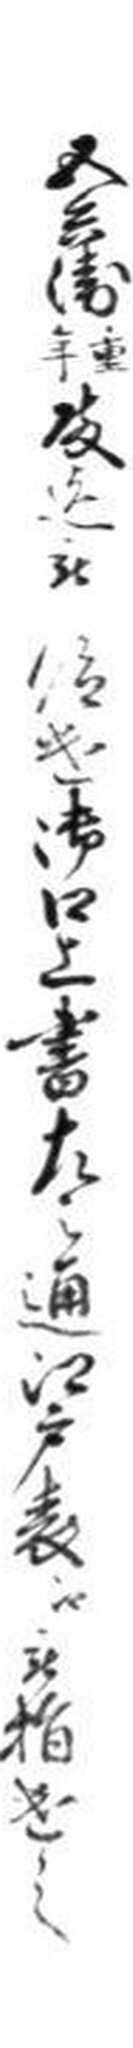年殿迄被仰遣御口上書左之通江戸表江被指遣之
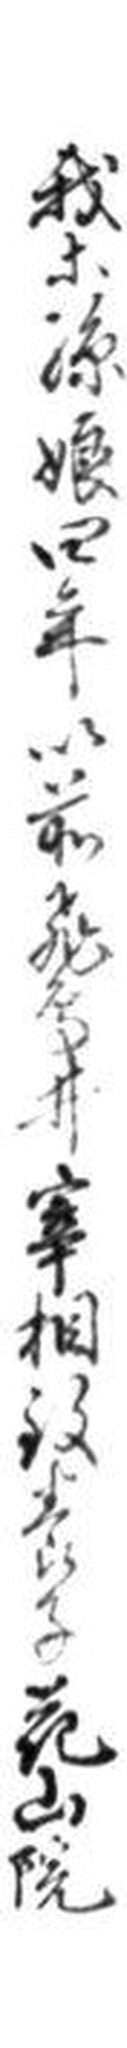我等孫娘四年以前飛鳥井宰相致養子花山院
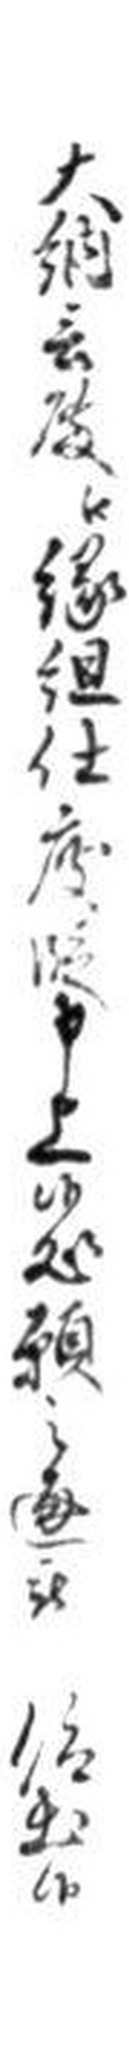大納言殿江縁組仕度段申上候処願之通被仰出候
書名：家譜 二十二 吉品公 従元禄十五年到同十六年
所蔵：福井県文書館 Fukui Prefectural Archives
